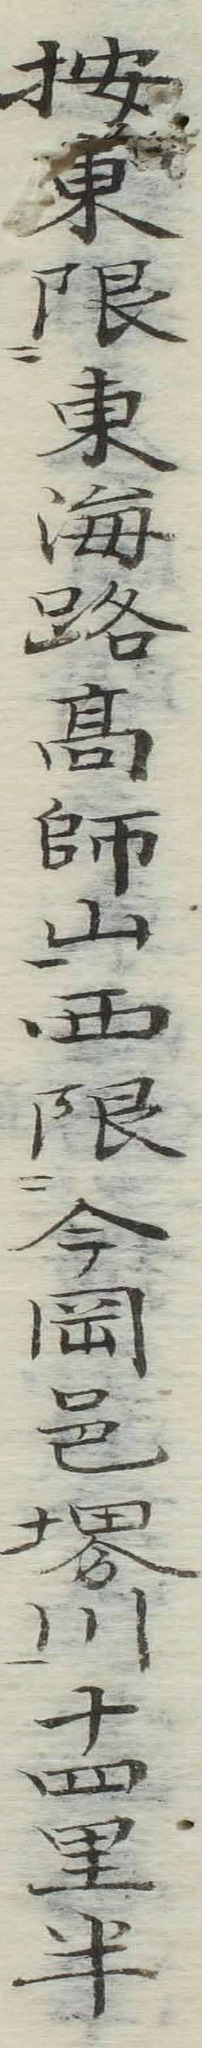按東限東海路髙師山西限今岡邑堺川十四里半
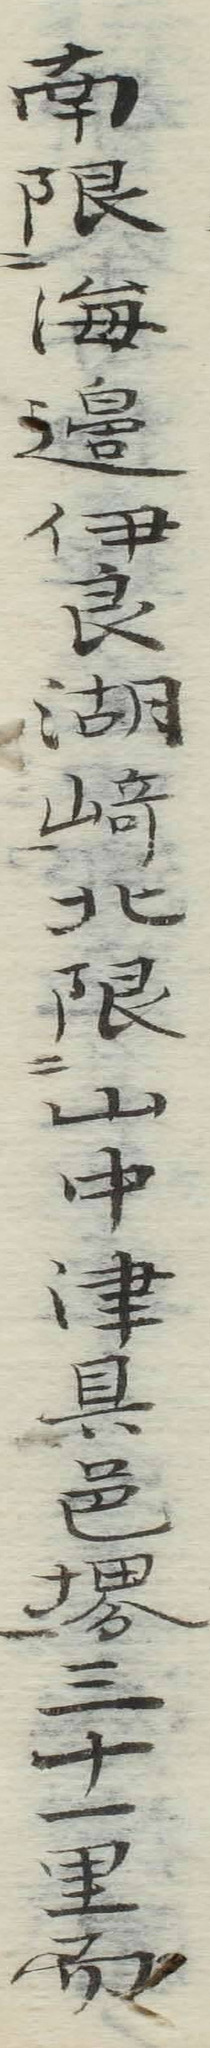南限海邉伊良湖崎北限山中津具邑堺三十一里而
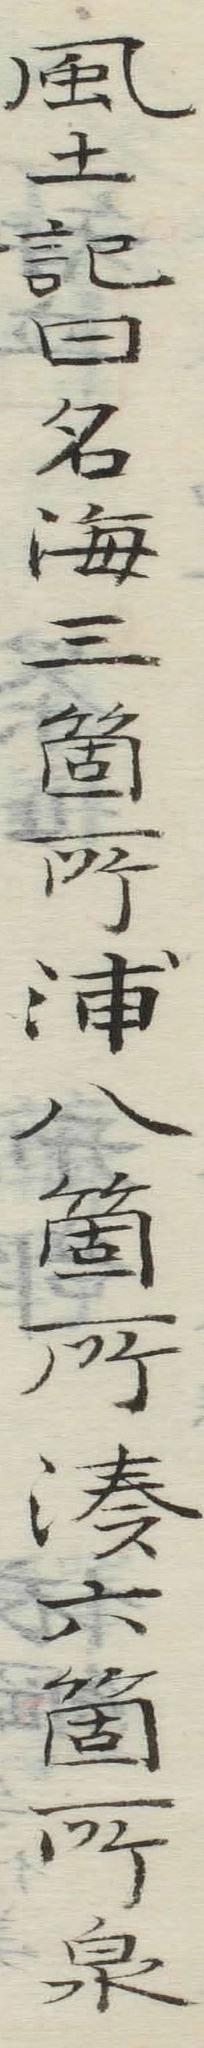風土記曰名海三箇所浦八箇所湊六箇所泉
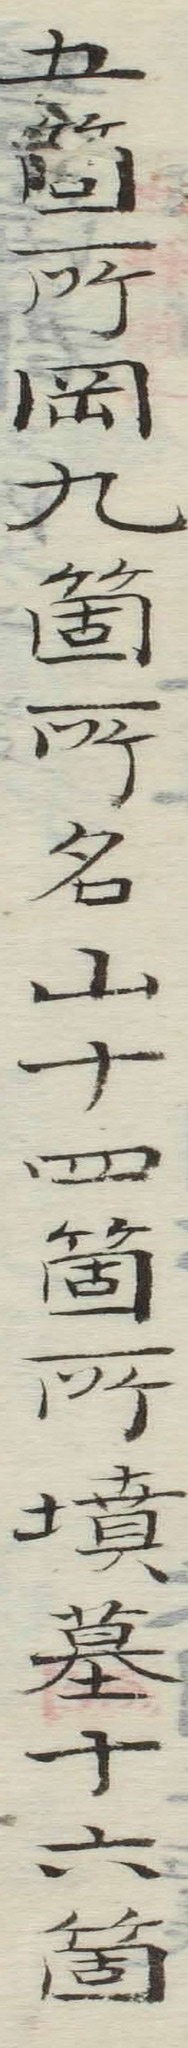五箇所岡九箇所名山十四箇所墳墓十六箇
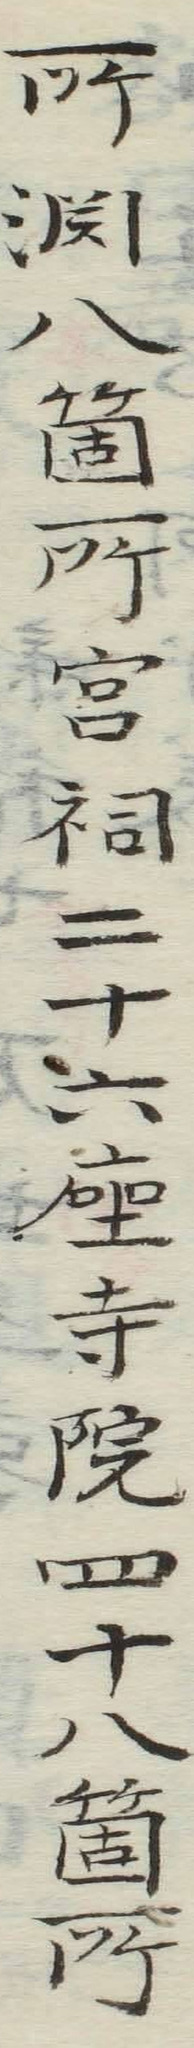所淵八箇所宮祠二十六座寺院四十八箇所
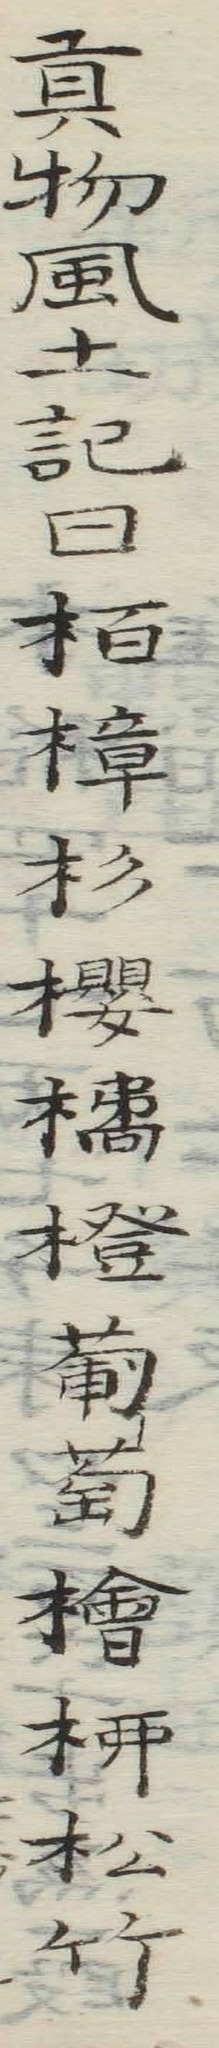貢物風土記曰柏樟杉櫻橘橙葡萄檜柳松竹
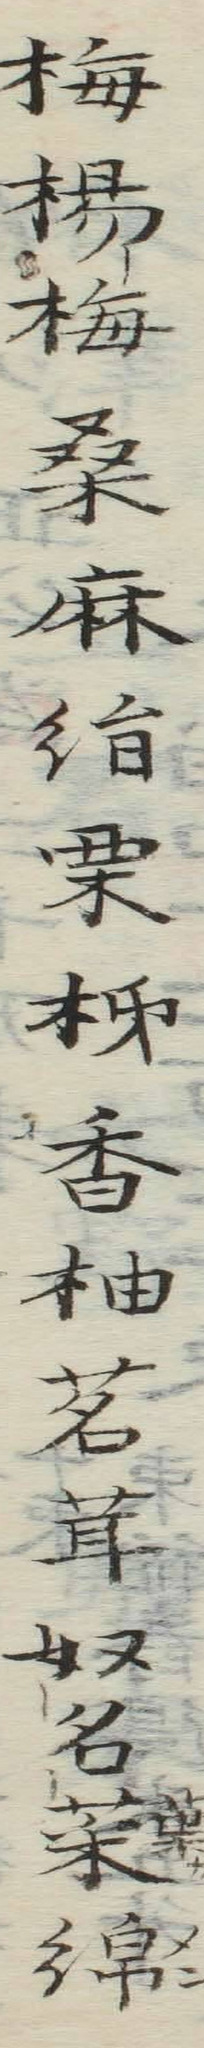梅楊-梅桑麻絹栗柿香柚茗茸奴-名-菜綿
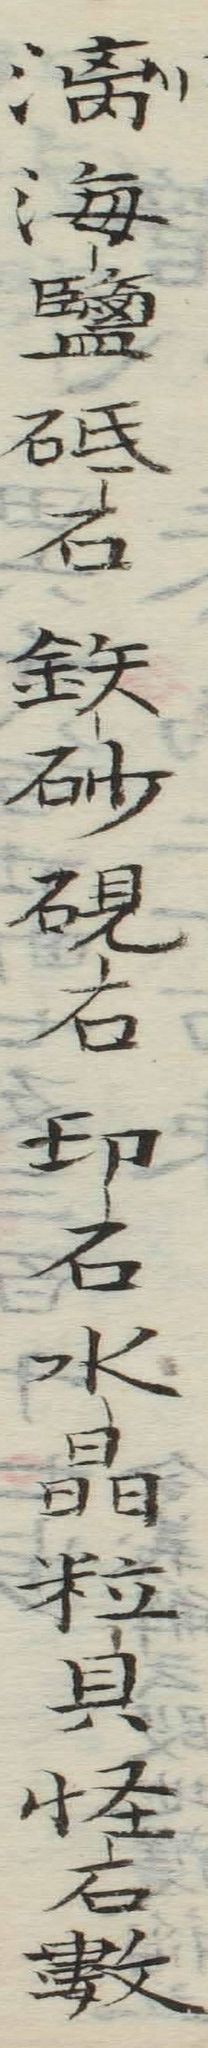漓海-鹽砥-石鉄-砂硯-石印-石水-晶粒-貝怪-石數
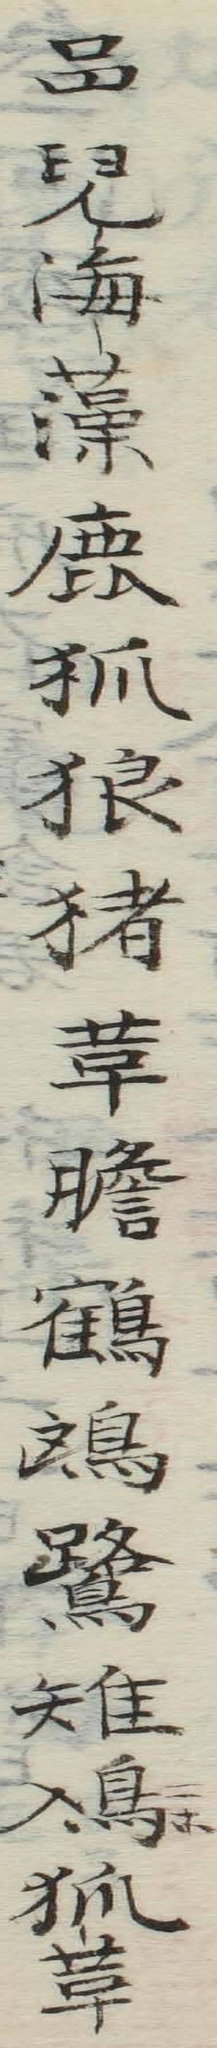品兒-海-藻鹿狐狼猪革膽鶴鴎鷺雉鳰狐-革
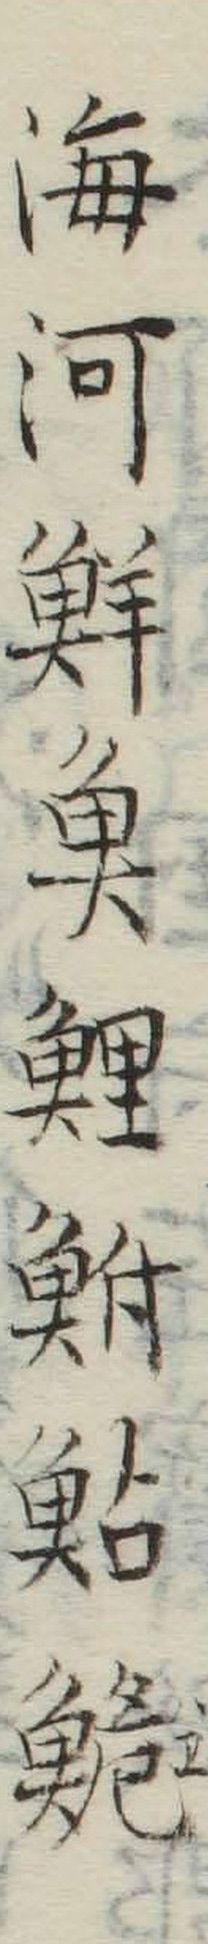海河鮮魚鯉鮒鮎鮠
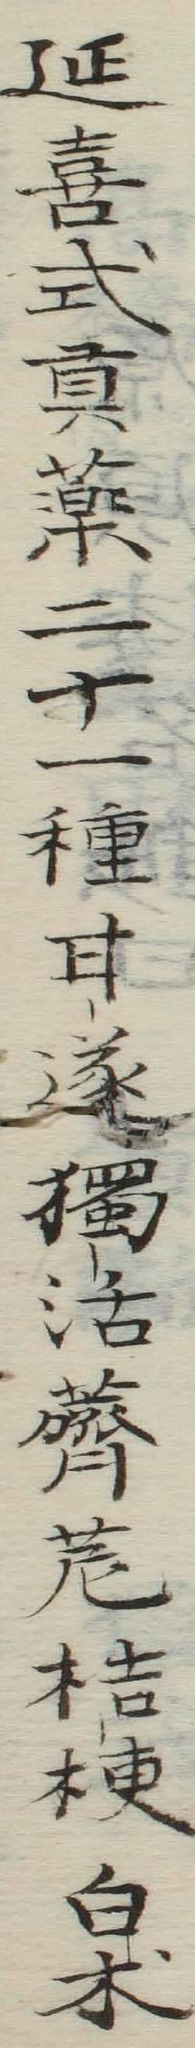延喜式貢薬二十一種甘-遂獨-活薺苨桔-梗白-木
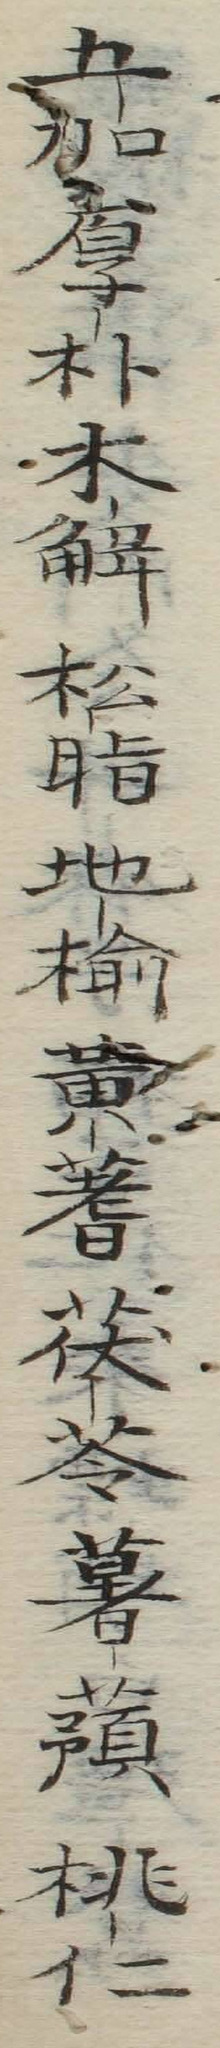五-加厚-朴木-解松-脂地-楡黄-蓍茯-苓薯-蕷桃-仁

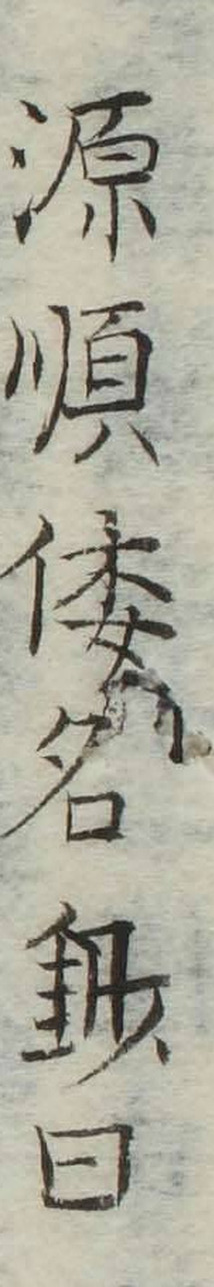源順倭名鈔曰
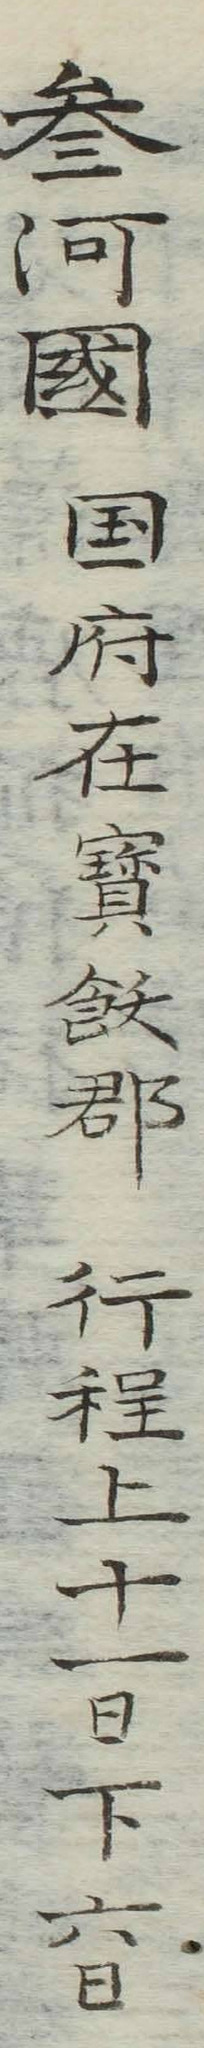参河國国府在寳飫郡行程上十一日下六日
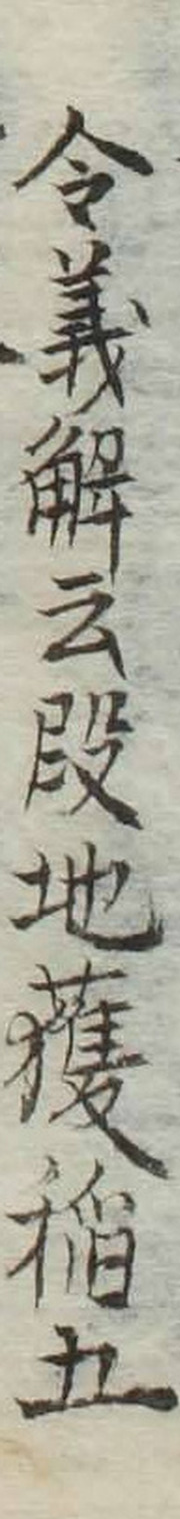令義解云段地獲稲五
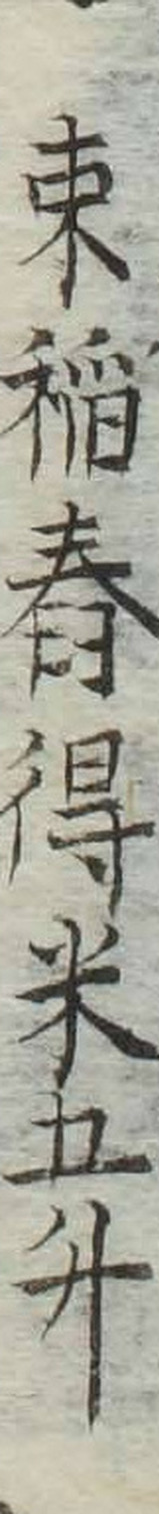束稲舂得米五升
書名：三河国二葉松
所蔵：国文学研究資料館
